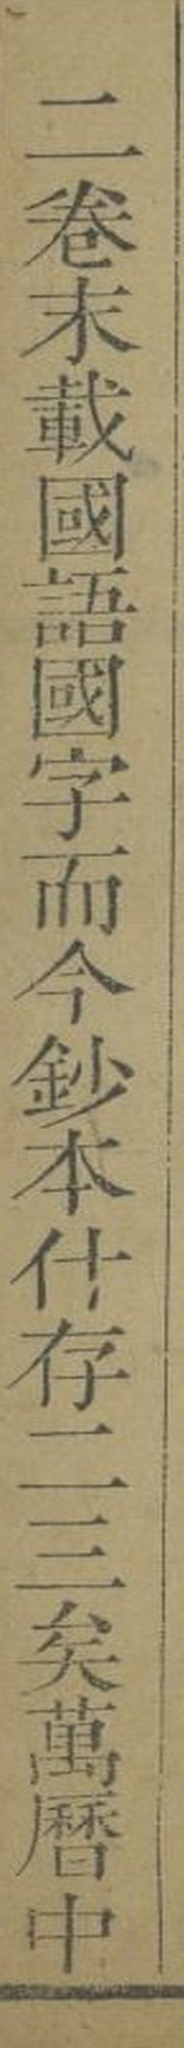二卷末載國語國字而今鈔本什存二三矣萬曆中

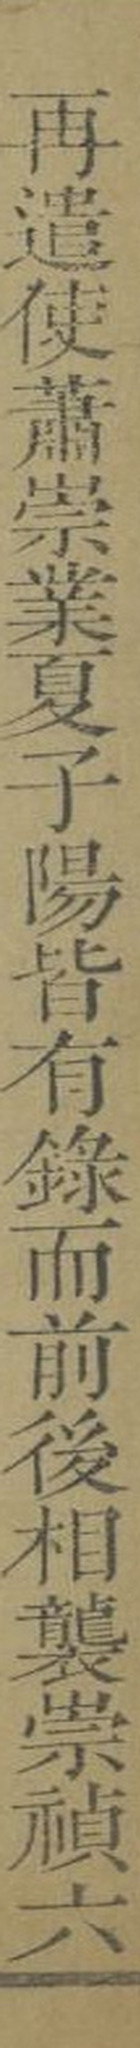再遣使蕭崇業夏子陽皆有錄而前後相襲崇禎六
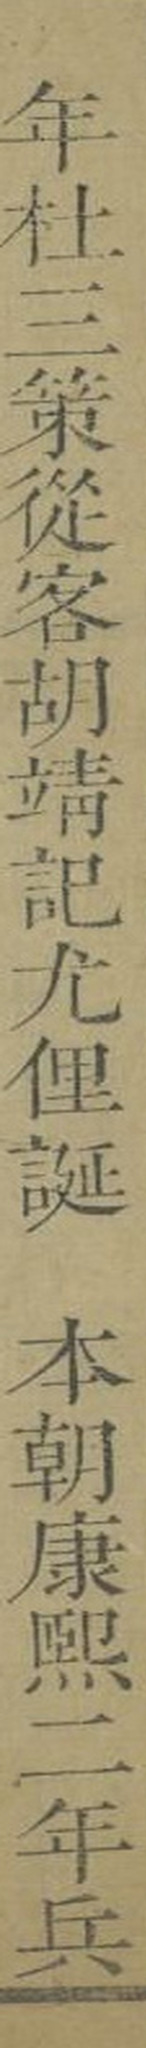年杜三策從客胡靖記尤俚誕本朝康煕二年兵
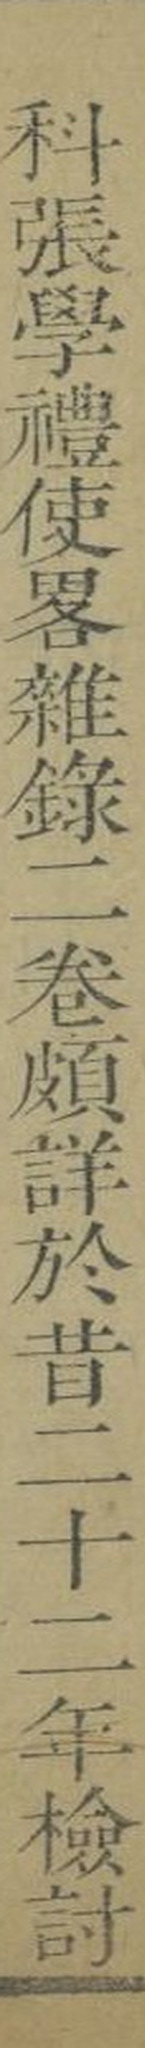科張學禮使畧雜錄二卷頗詳於昔二十二年檢討
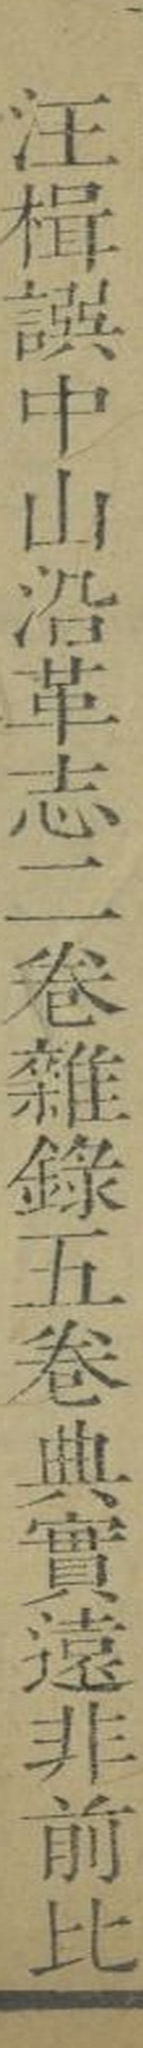汪楫譔中山沿革志二卷雜錄五卷典實遠非前比
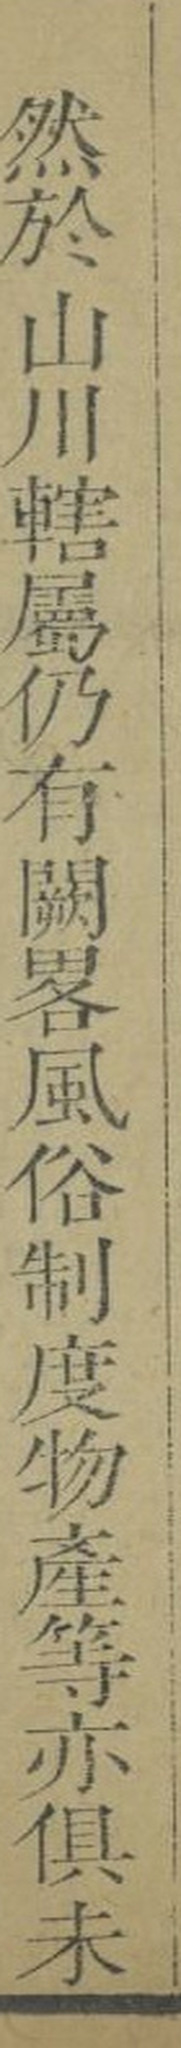然於山川轄屬仍有闕畧風俗制度物產等亦俱未
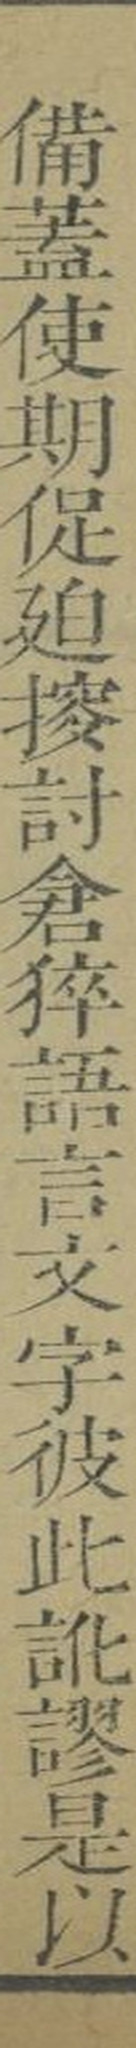備蓋使期促廹摉討倉猝語言文字彼此訛謬是以
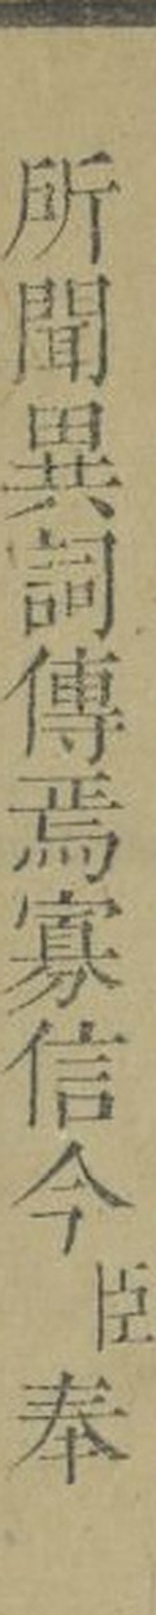所聞異詞傳焉寡信今臣奉
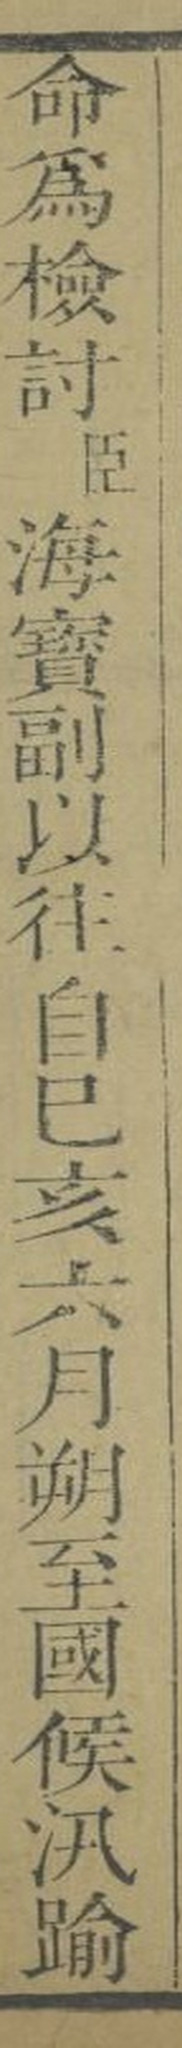命爲檢討臣海寳副以往自巳亥六月朔至國候汛踰
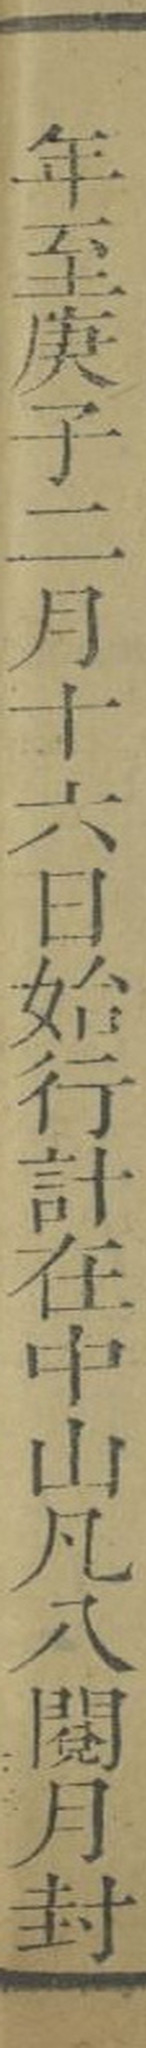年至庚子二月十六日始行計在中山凡八閱月封
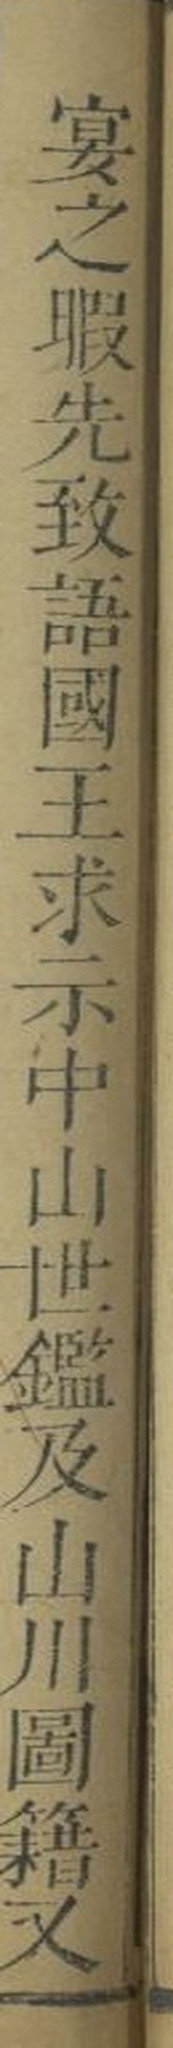宴之暇先致語國王求示中山世鑑及山川圖籍又
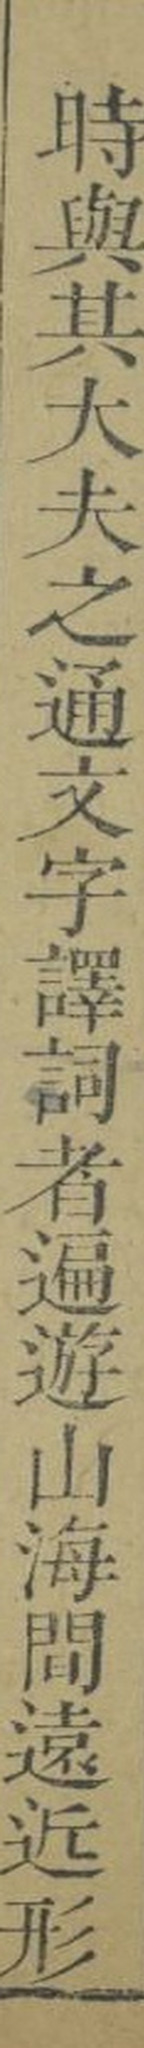時與其大夫之通文字譯詞者遍遊山海間遠近形
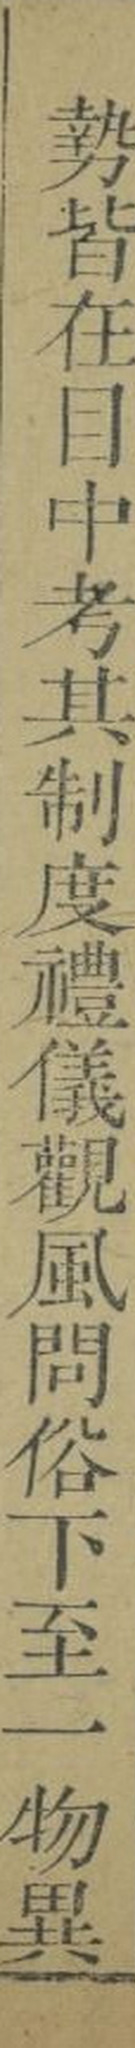勢皆在目中考其制度禮儀觀風問俗下至一物異
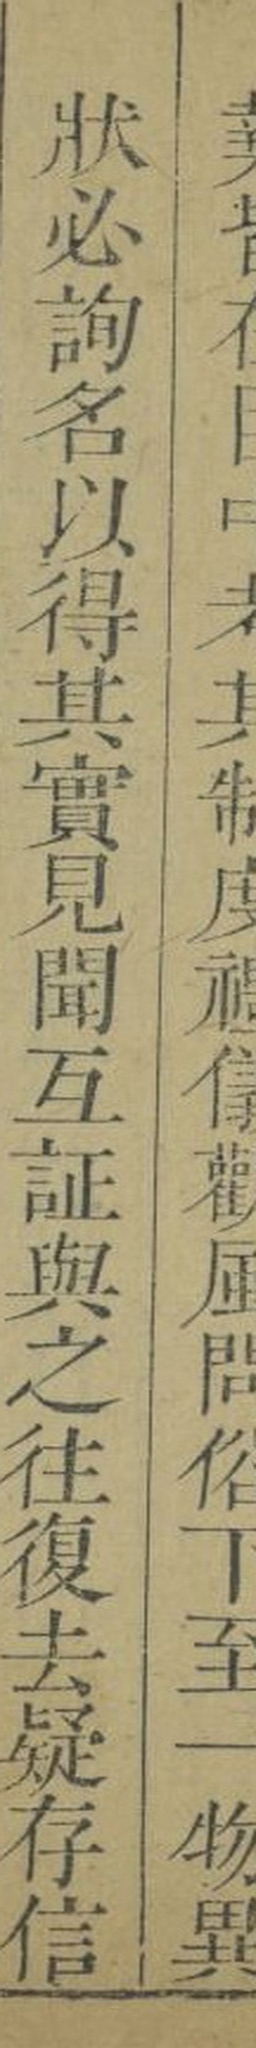狀必詢名以得其實見聞互証與之往復去疑存信
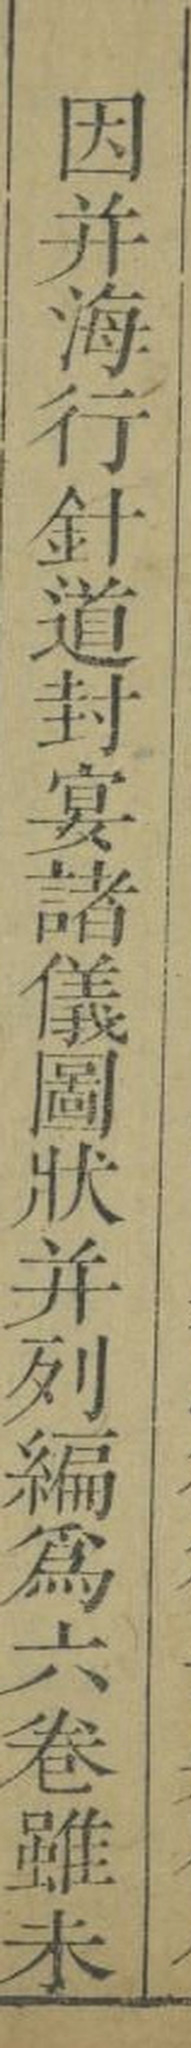因并海行針道封宴諸儀圖狀并列編爲六卷雖未
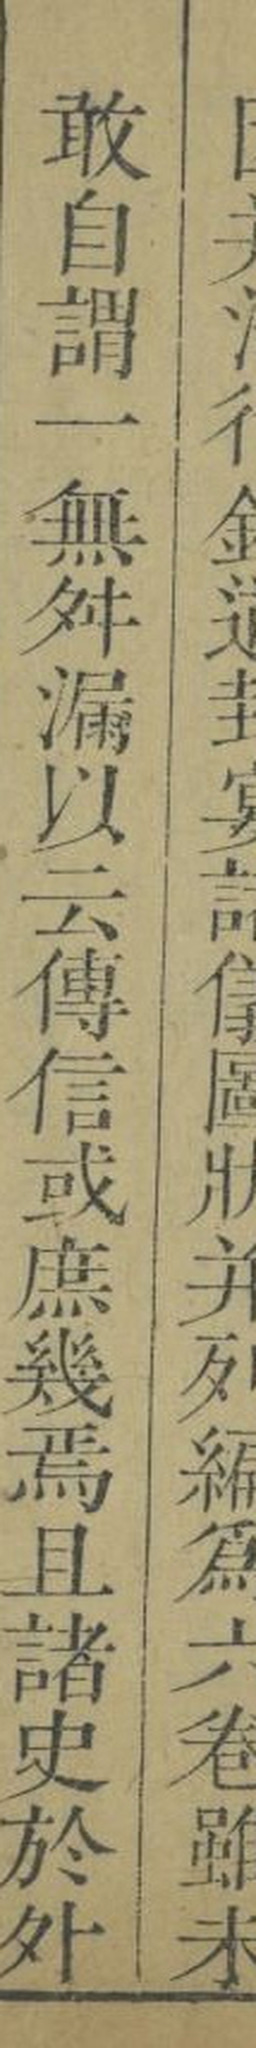敢自謂一無舛漏以云傳信或庶幾焉且諸史於外
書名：中山伝信録 巻一
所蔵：University of the Ryukyus Library
